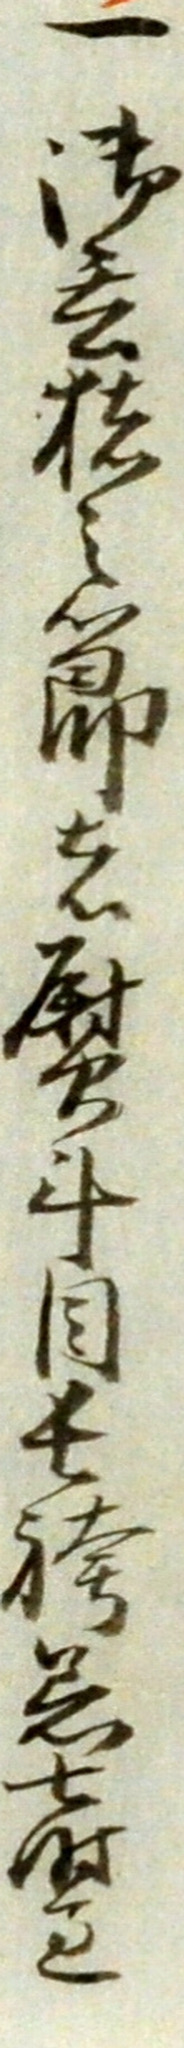一御玄猪之節は熨斗目長袴着七時過
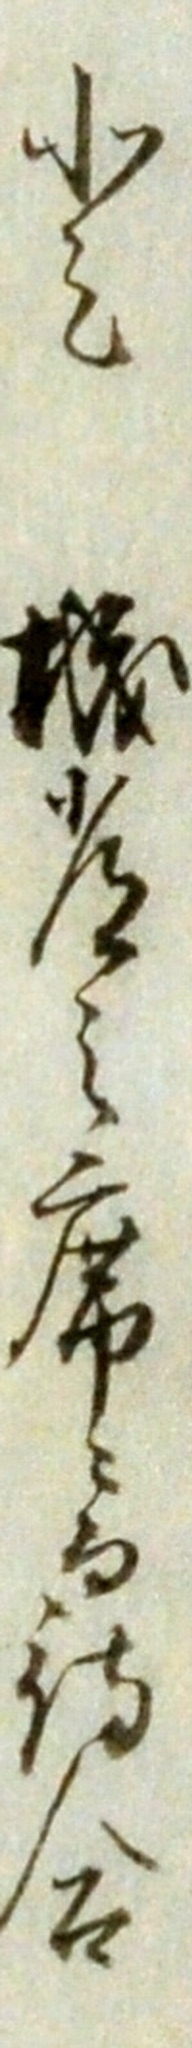登城常之席にて待合
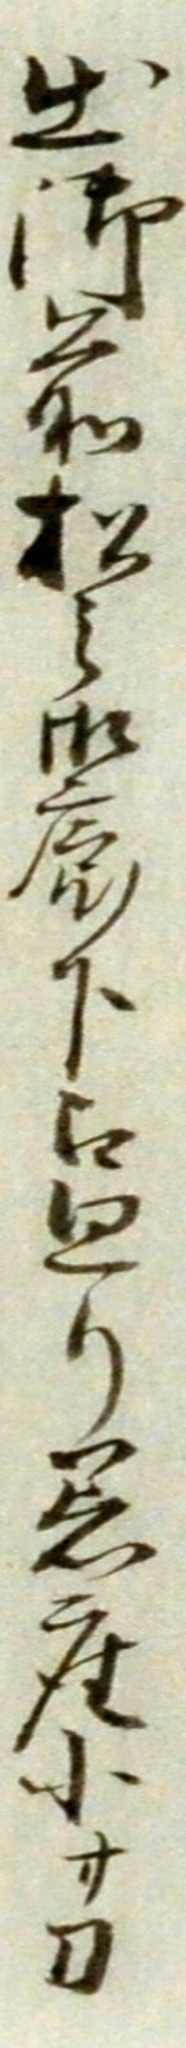出御前松之御廊下え廻り着座小サ刀
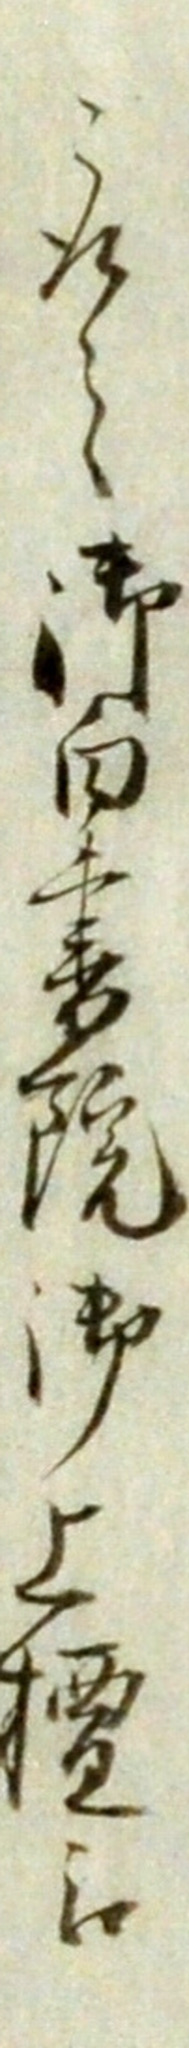取之御白書院御上壇え
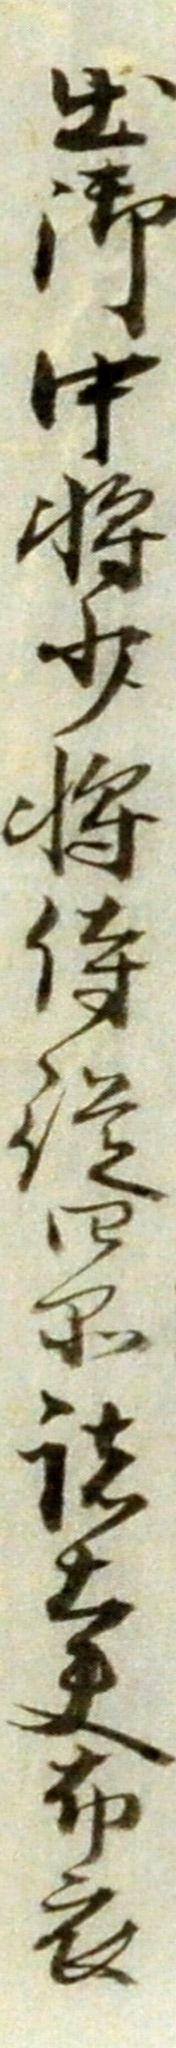出御中将少将侍従四品諸大夫布衣
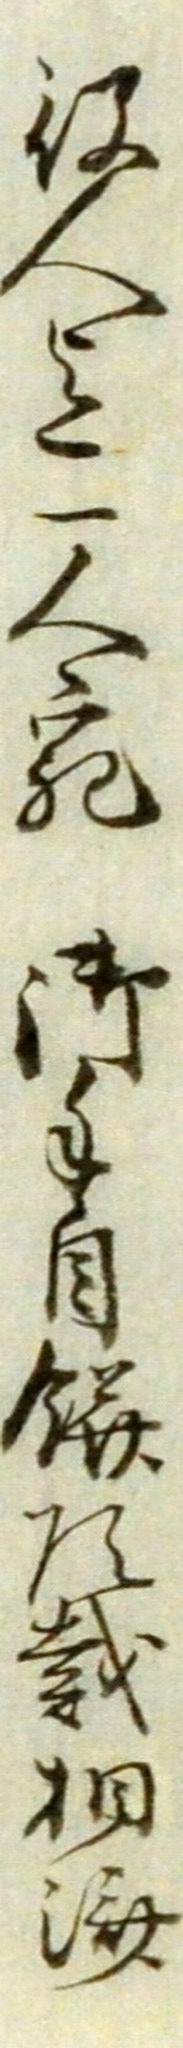役人迄一人宛御手自餅頂戴相済
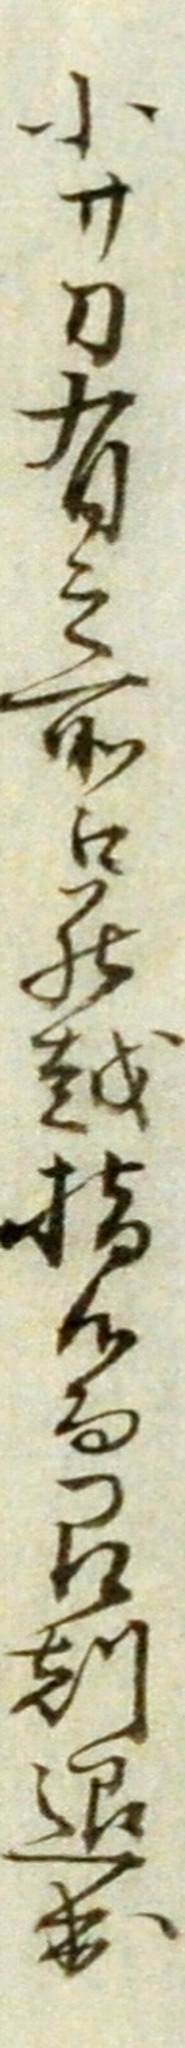小サ刀有之所え罷越指候て即刻退出
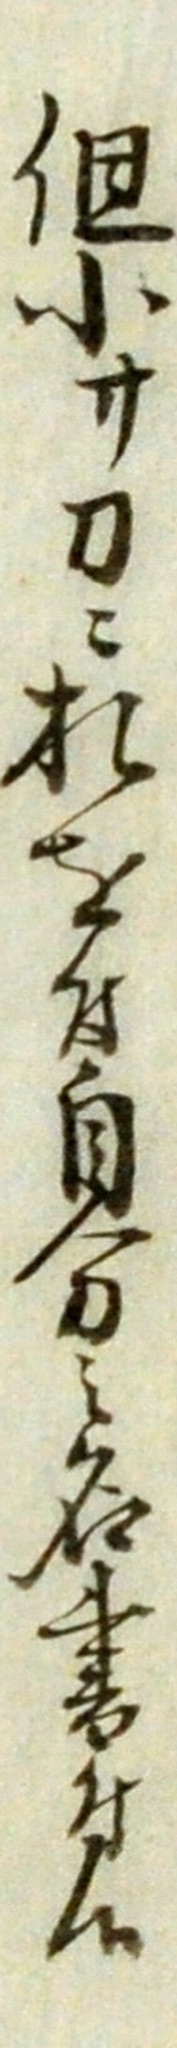但小サ刀に札を付自分之名書付候
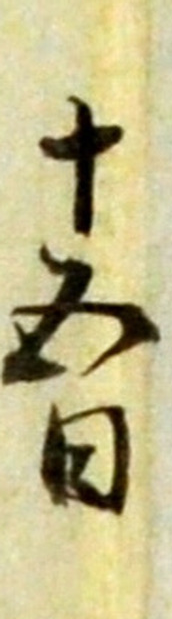十五日
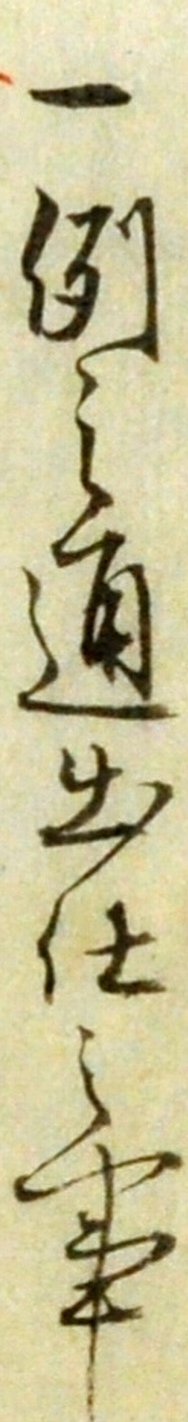一例之通出仕之事
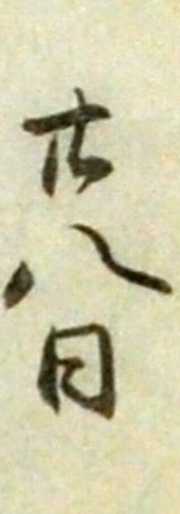廿八日
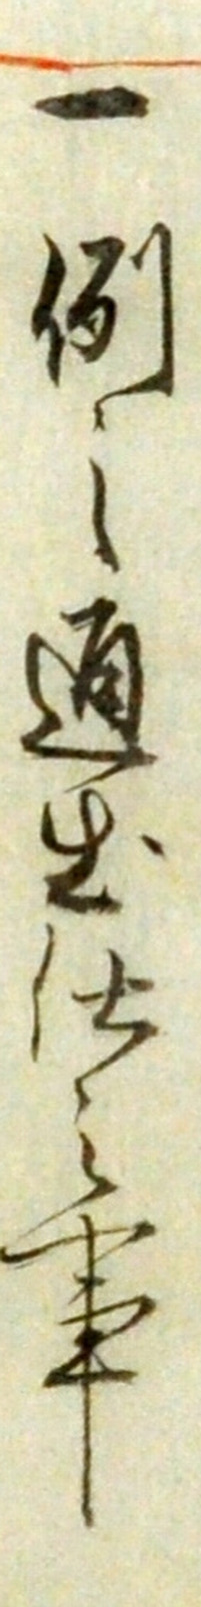一例之通出仕之事
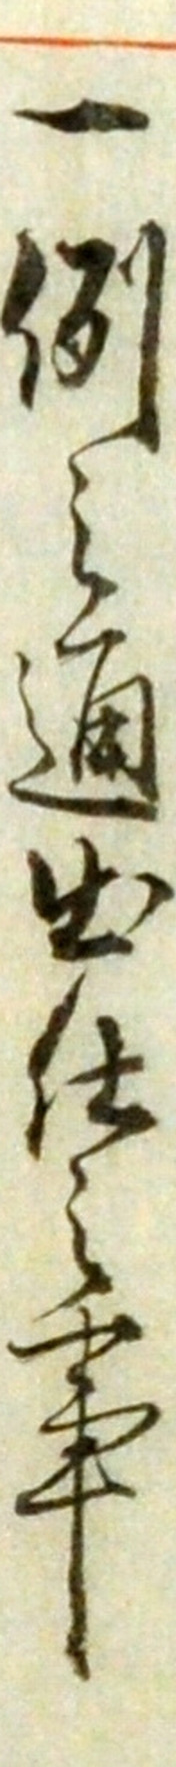一例之通出仕之事

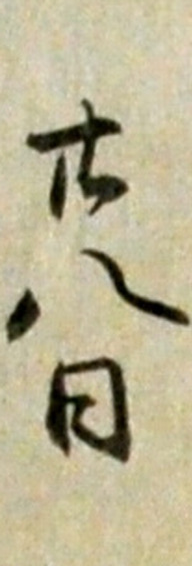廿八日
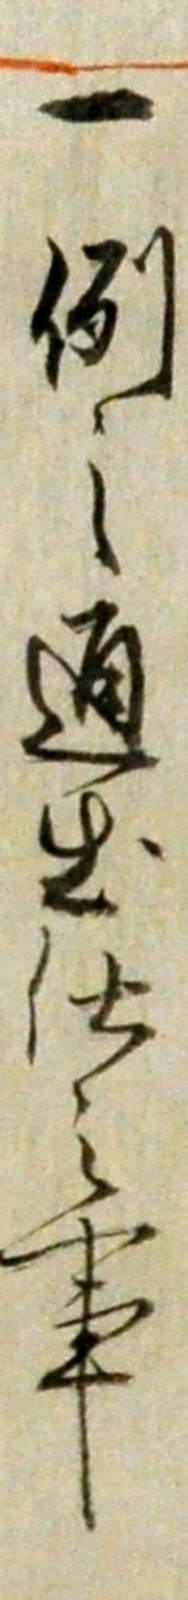一例之通出仕之事
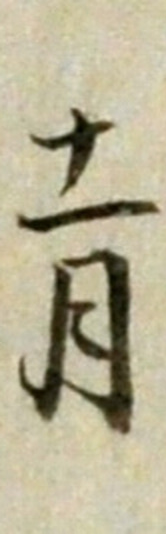十一月
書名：申合帳〔一括〕
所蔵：伊那市立高遠町図書館・合同会社AMANE
